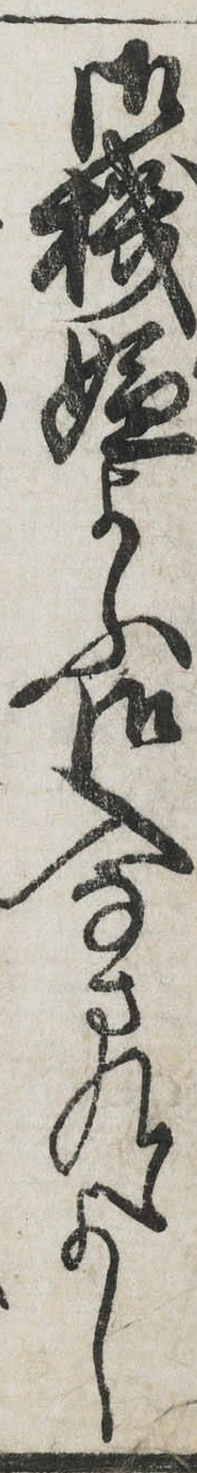御機嫌よふ御入なされ候よし
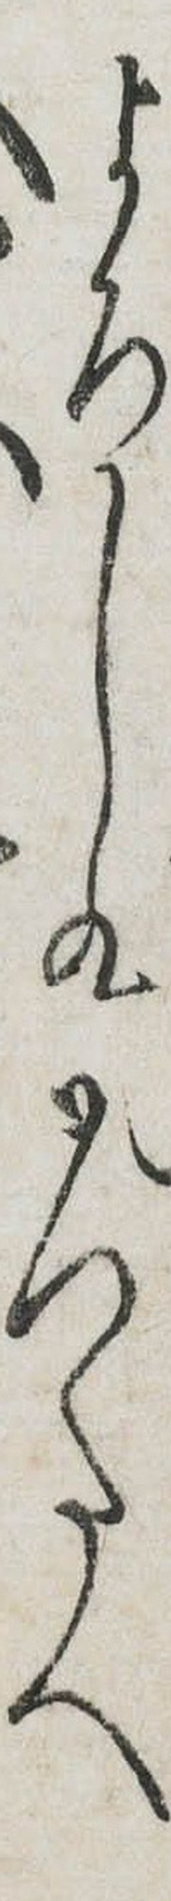よろしく御つたへ
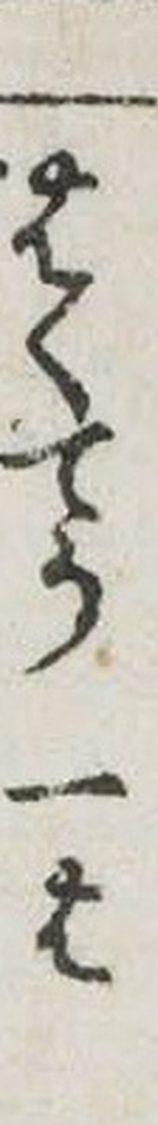はくてう一は
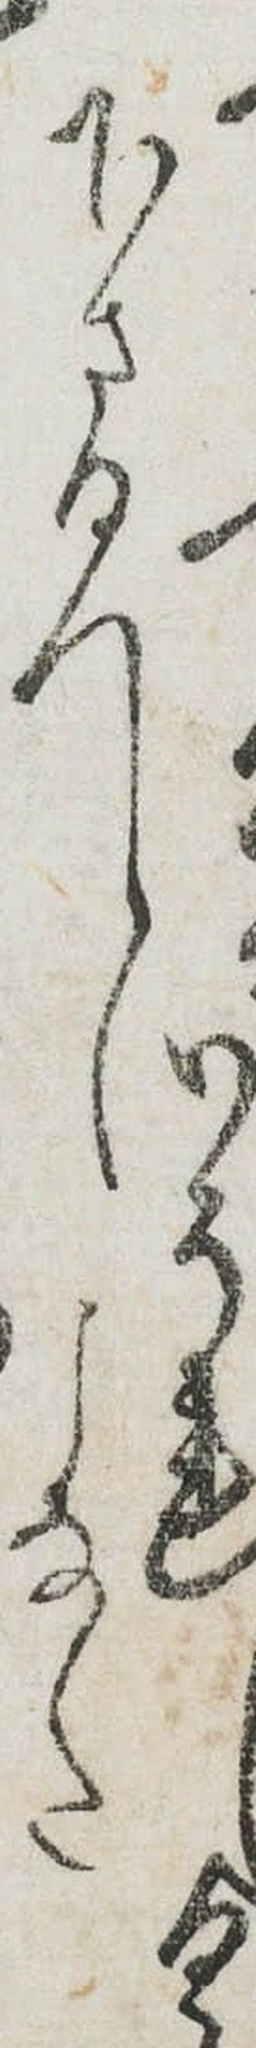下さるへく候こなた
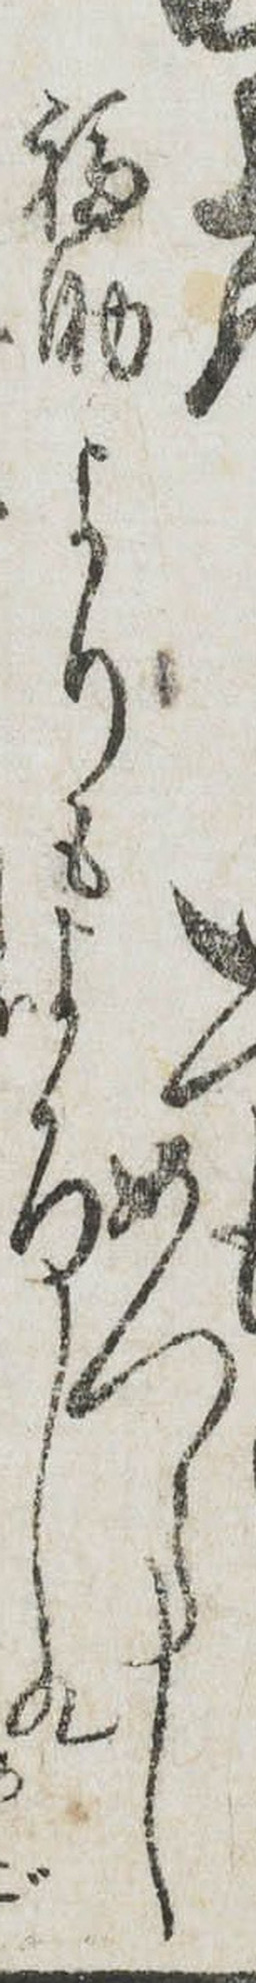福助よりもよろしく
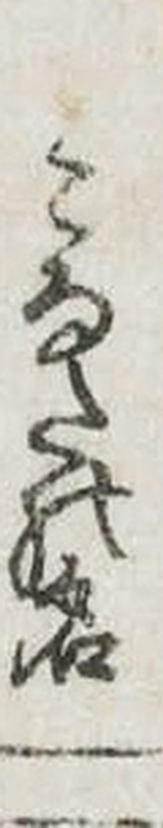こなたの名
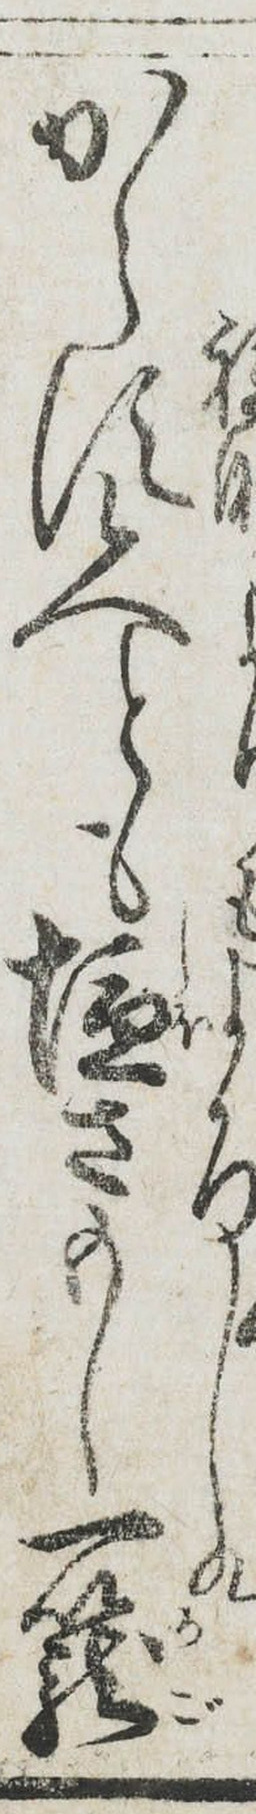からす候へとも塩さかし一籠
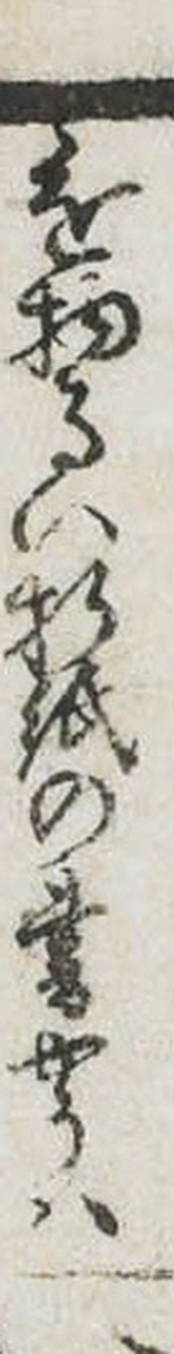進物るい折紙の書やうは
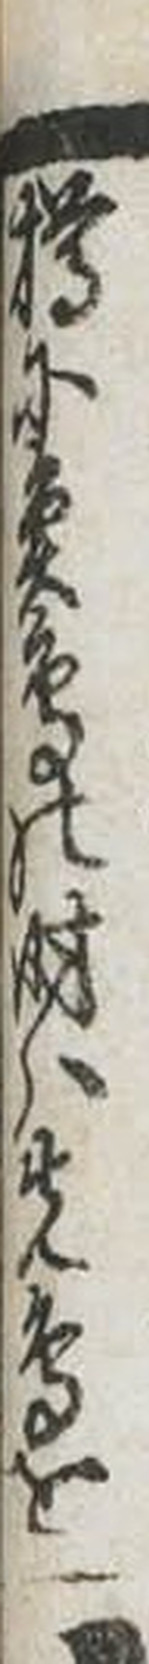樽に魚鳥の時は先鳥を
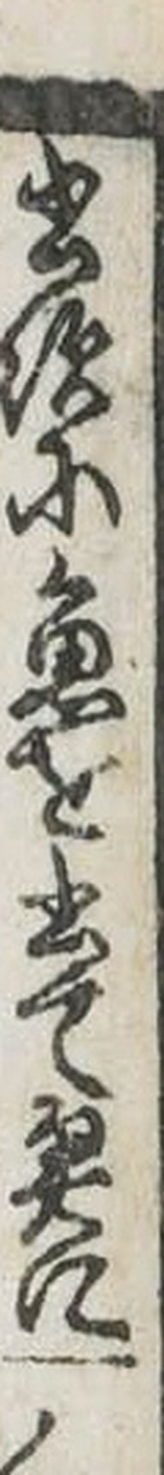書次に魚を書て魚に
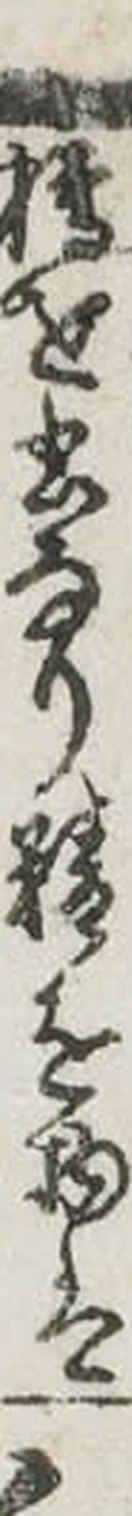樽を書るなり精進物は
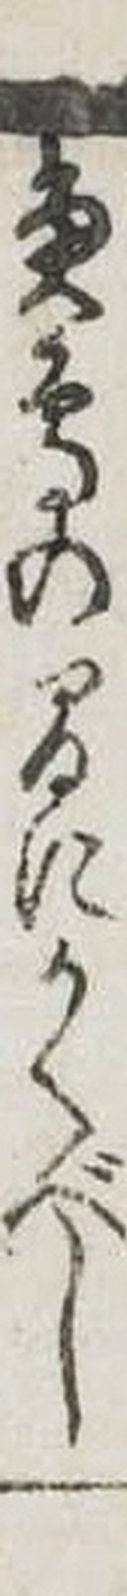魚鳥の間にかくべし
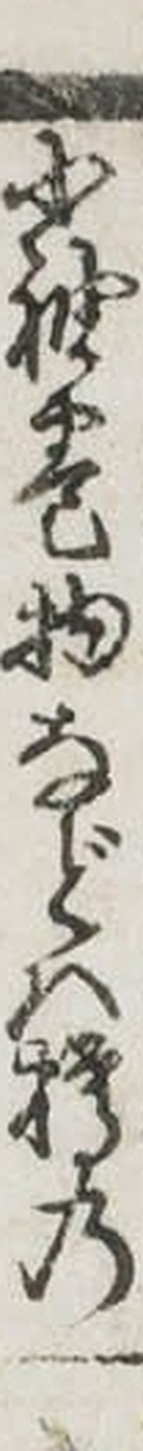小袖巻物などは樽の
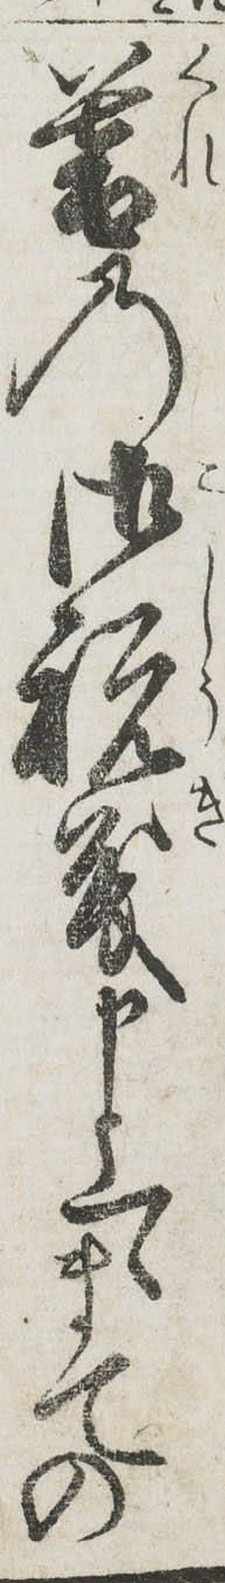暮の御祝儀申上候まての
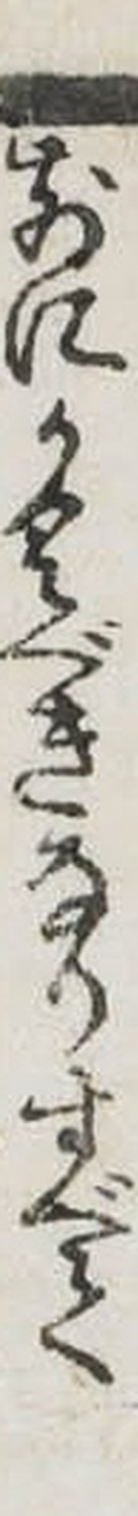前にかくべきなりすべて
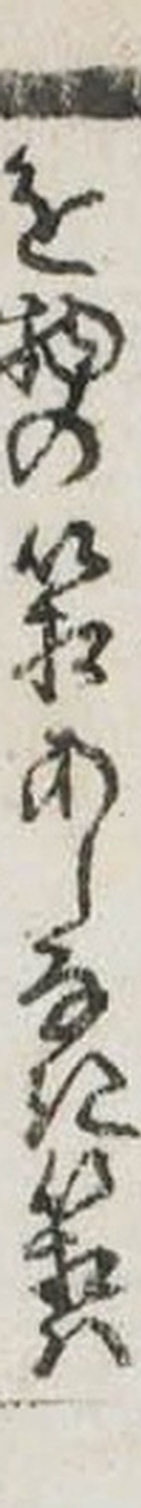進物の箱あしなき箱は
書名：頭書萬用婦人手紙之文言
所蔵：東京学芸大学教育コンテンツアーカイブ
